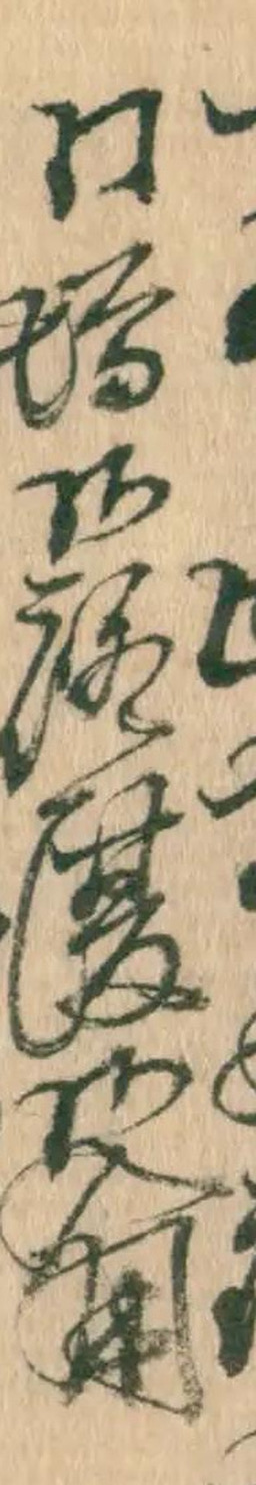同増御修復御入用
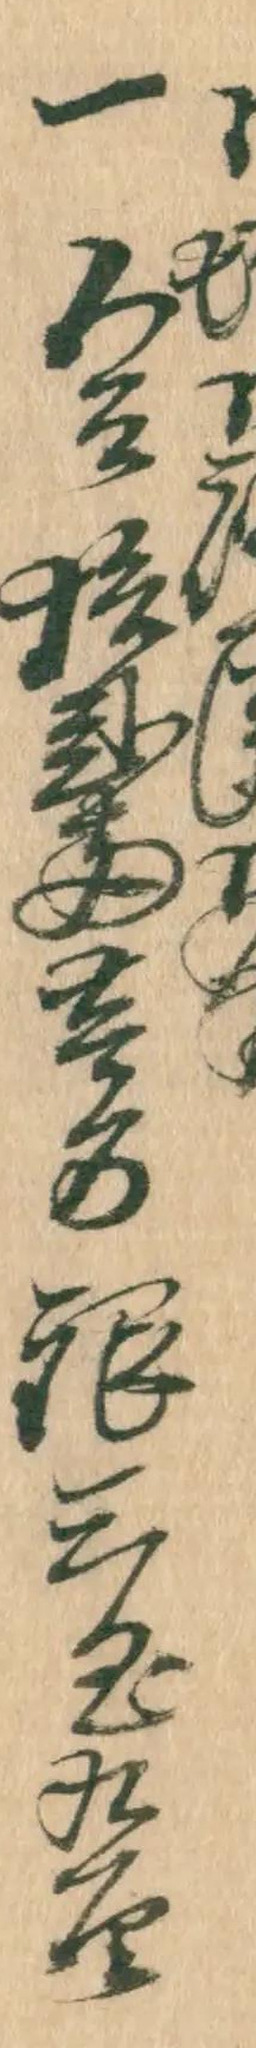一金拾弐両壱分銀三匁九厘

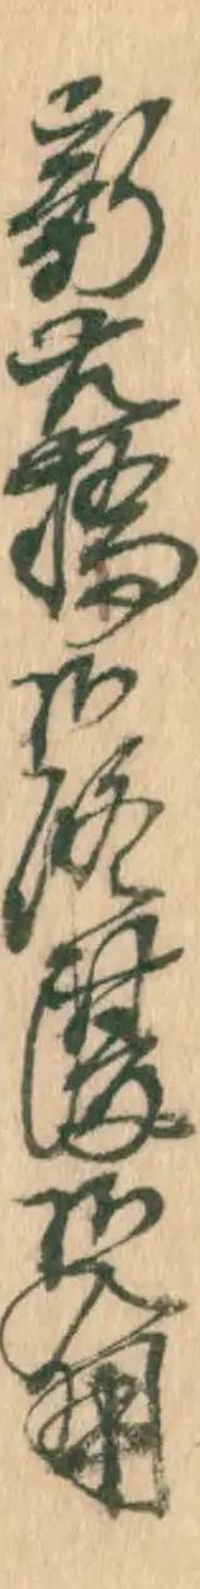新大橋御修復御入用
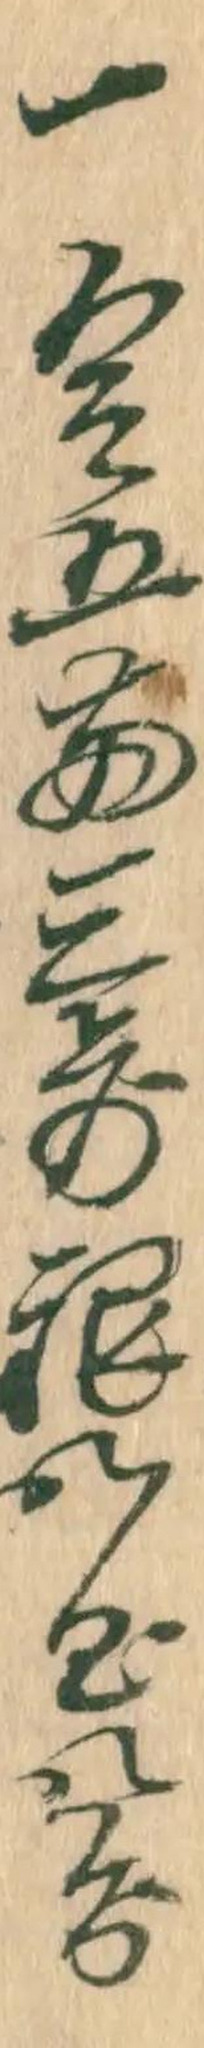一金五両三歩銀八匁八分
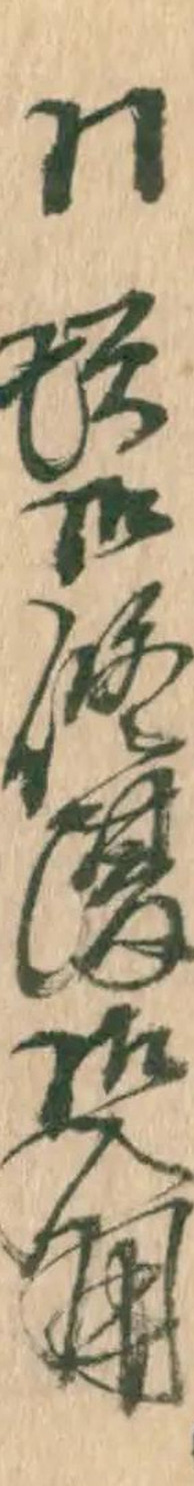同増御修復御入用
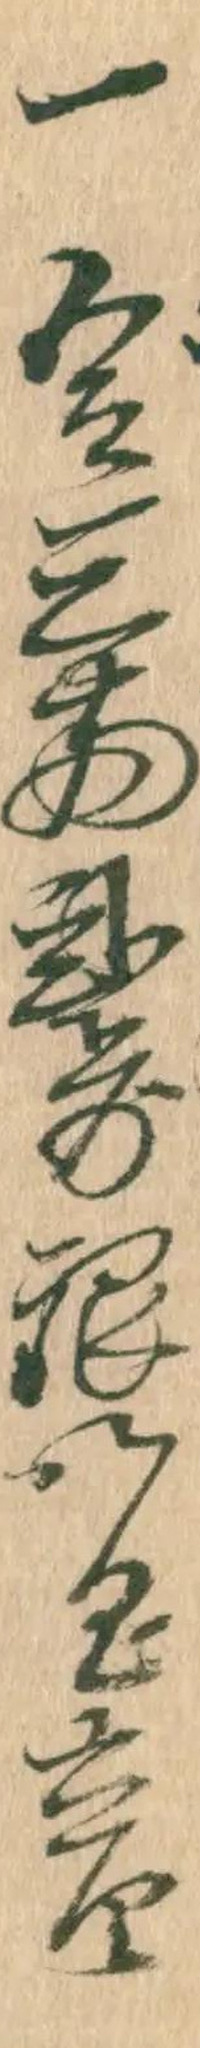一金三両弐歩銀八匁六厘
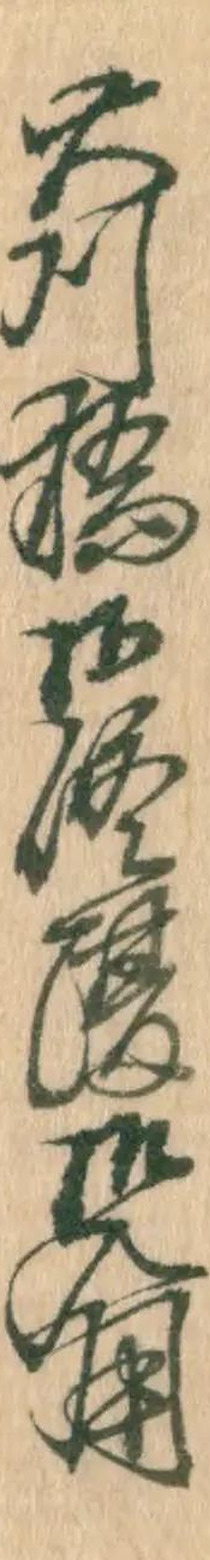大川橋御修復御入用
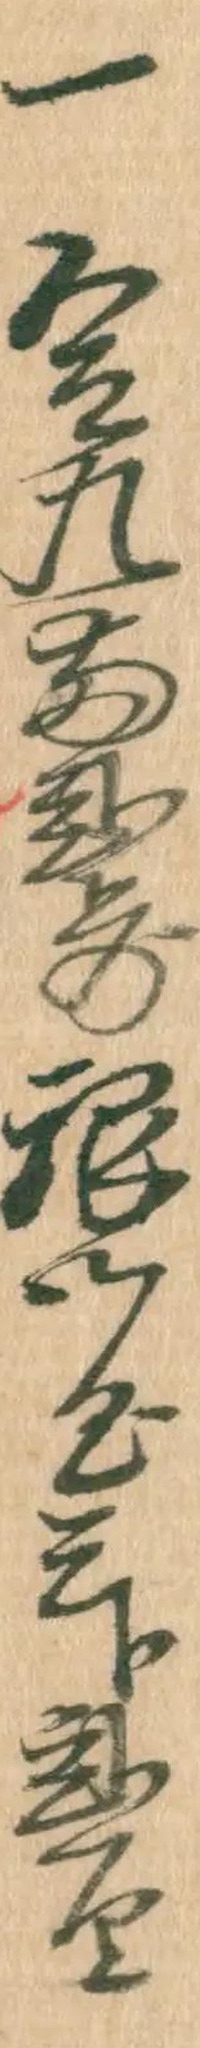一金九両弐歩銀八匁三分弐厘
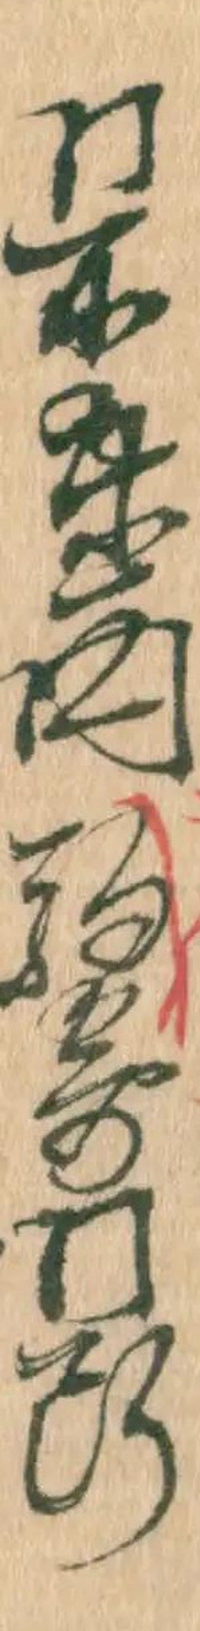同所東西駒寄同断
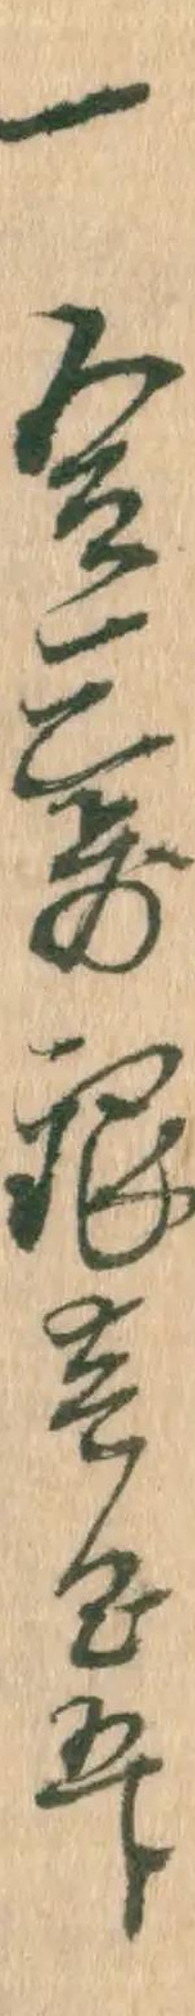一金三歩銀壱匁五分
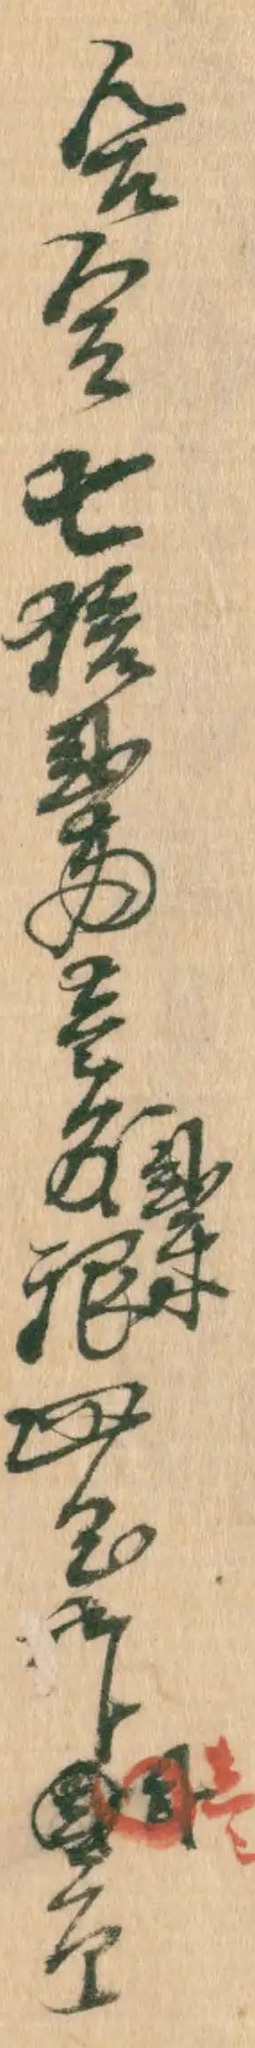合金七拾弐両壱分弐朱銀四匁五分「弐」厘
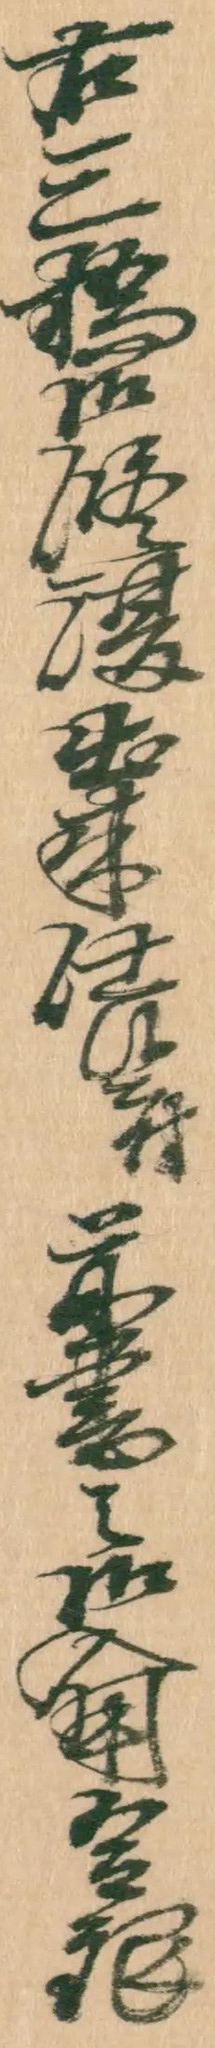右三橋御修復出来仕候ニ付前書之御入用金銀
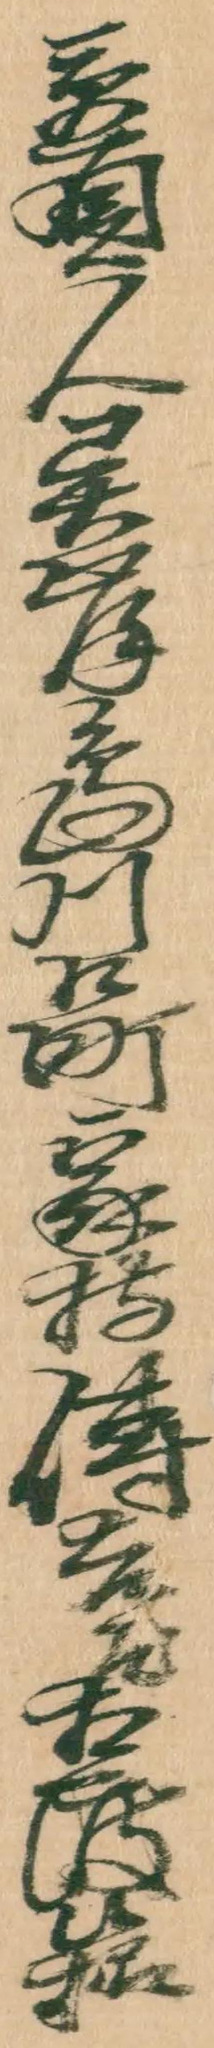受負人霊岸島川口町家持伝吉え相渡候様
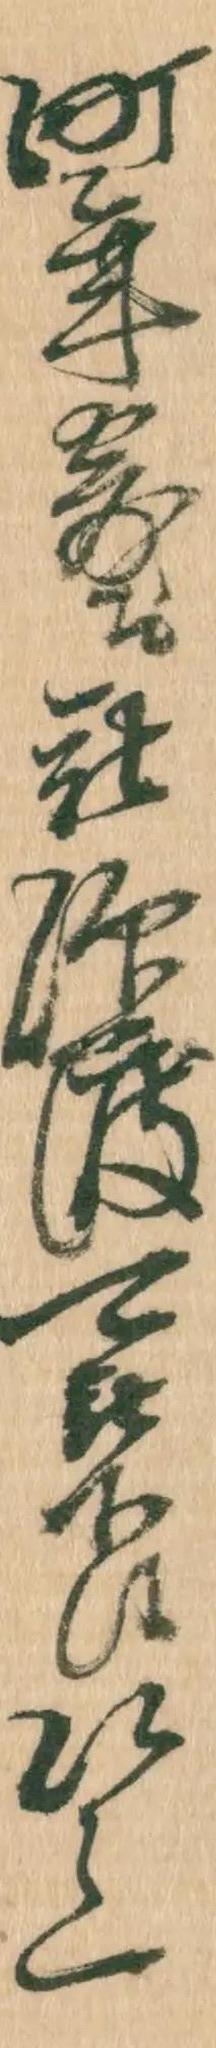町年寄え被仰渡可被下候以上
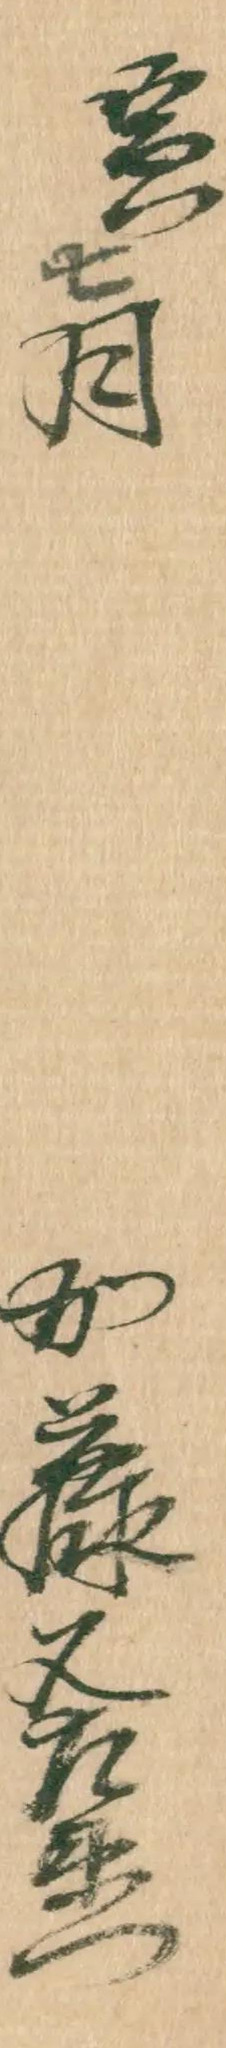寅七月加藤又左衛門
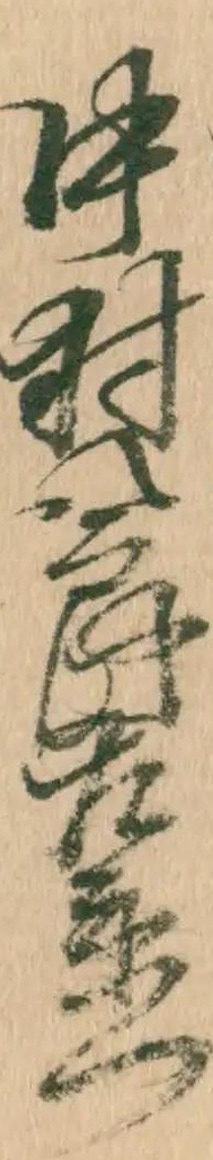中村八郎左衛門
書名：三橋 17巻. [8] 三橋小破御修復書留　但御奉行御掛リ替地震潰橋番屋　嘉永四亥年より安政二卯年迄　下
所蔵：国立国会図書館 National Diet Library, JAPAN
